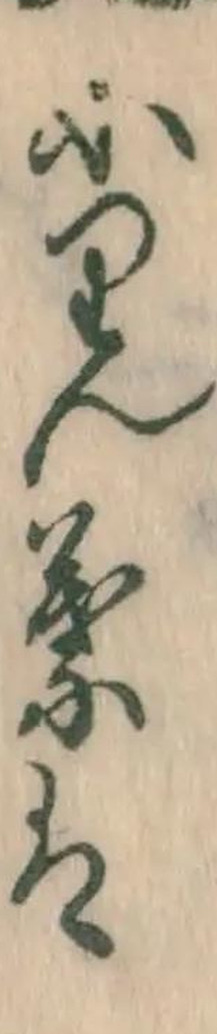小りん葉は

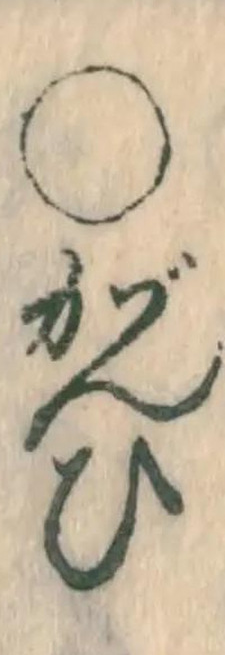〇がんひ
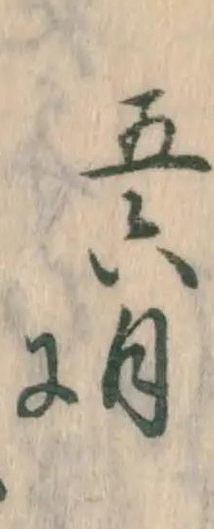五六月
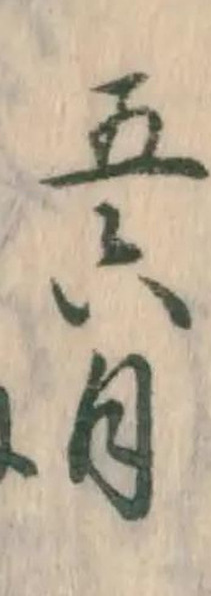五六月
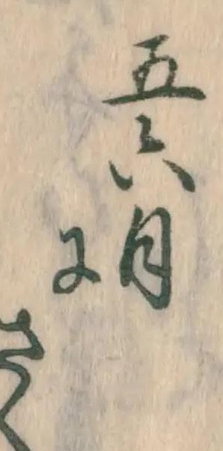五六月
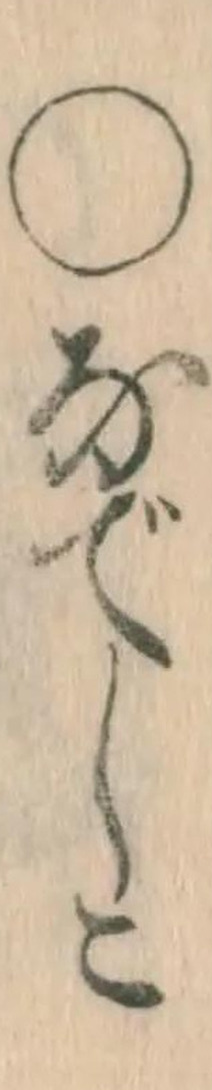〇なでしこ
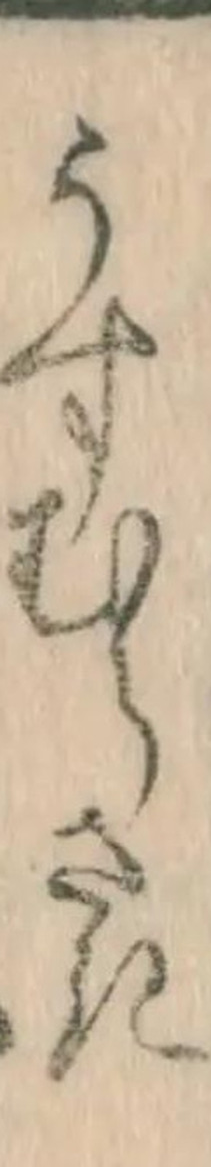うすむらさき
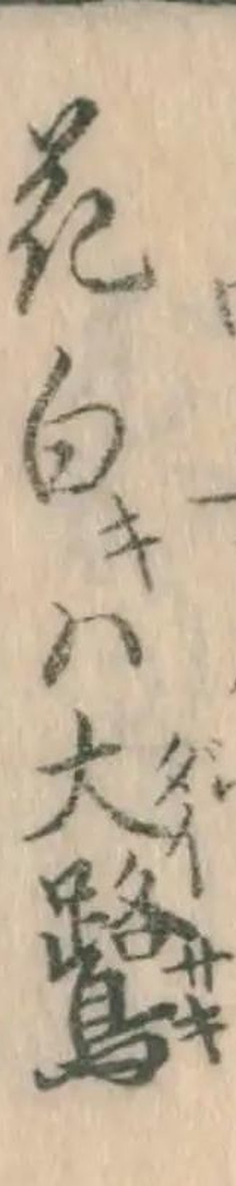花白きは大鷺
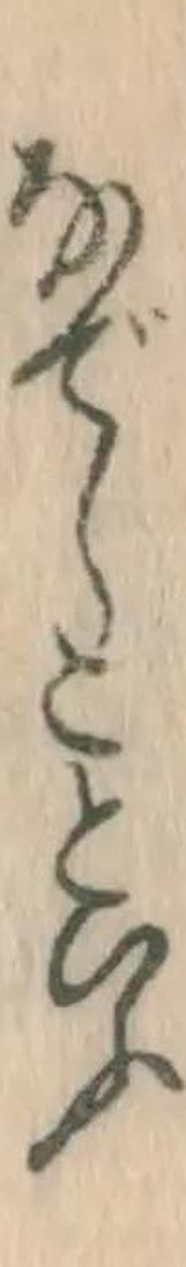なでしこといふ

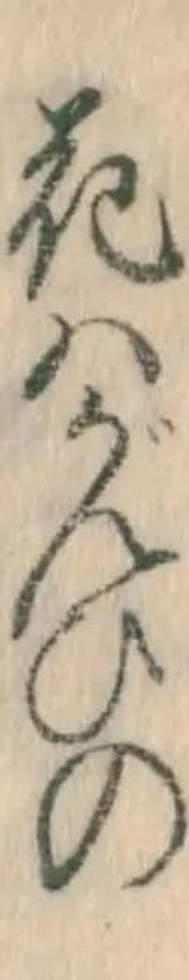花はがんひの
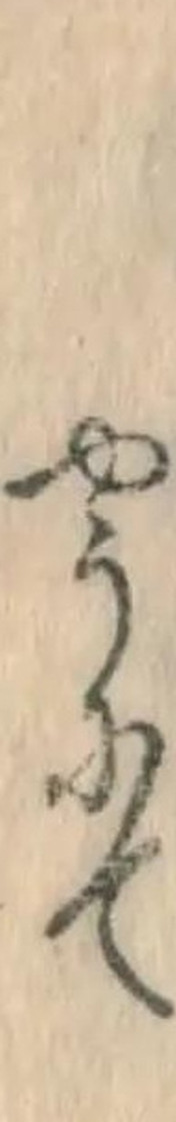やうにて
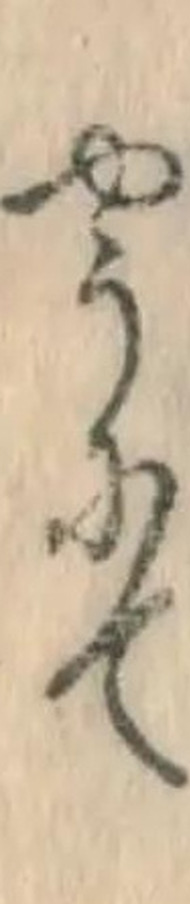やうにて
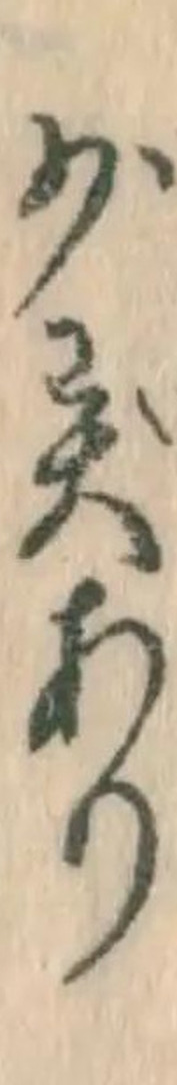少異あり
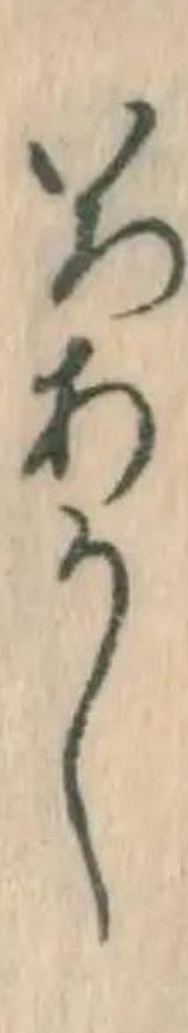いろあかく
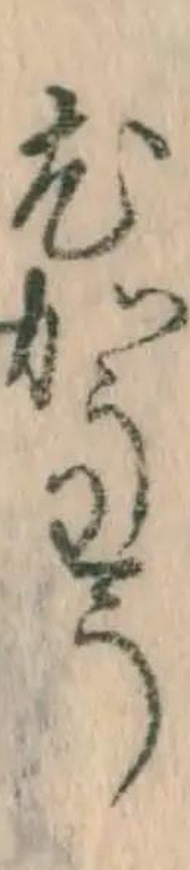老かうわう
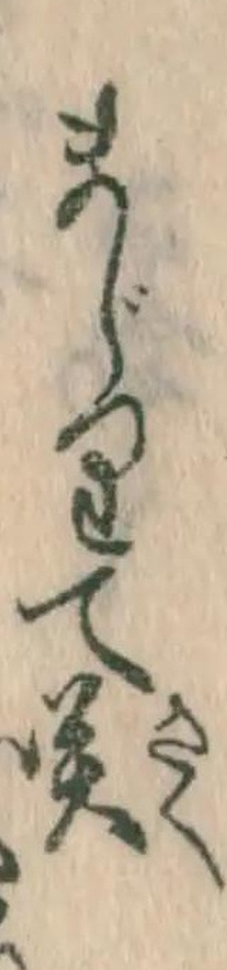まじりて咲
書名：艸花繪前集. [1]
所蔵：国立国会図書館 National Diet Library, JAPAN
